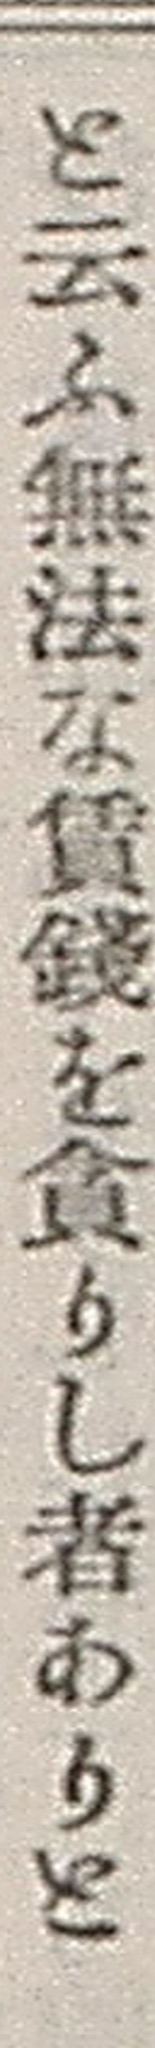と云う無法な賃銭を貪りし者ありと
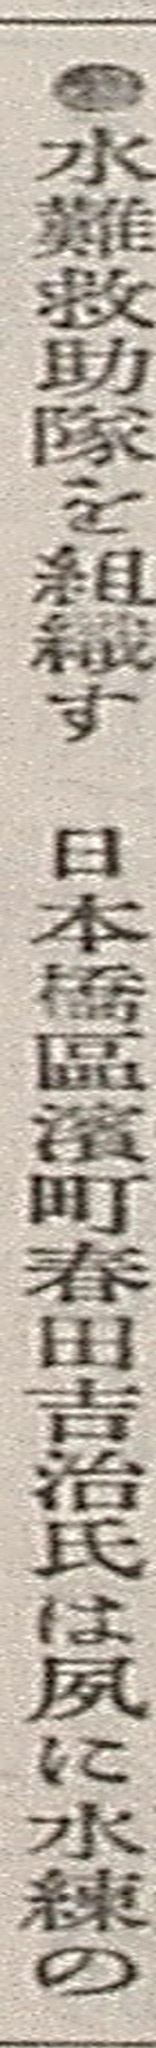●水難救助隊を組織す日本橋区浜町春田吉治氏は夙に水練の
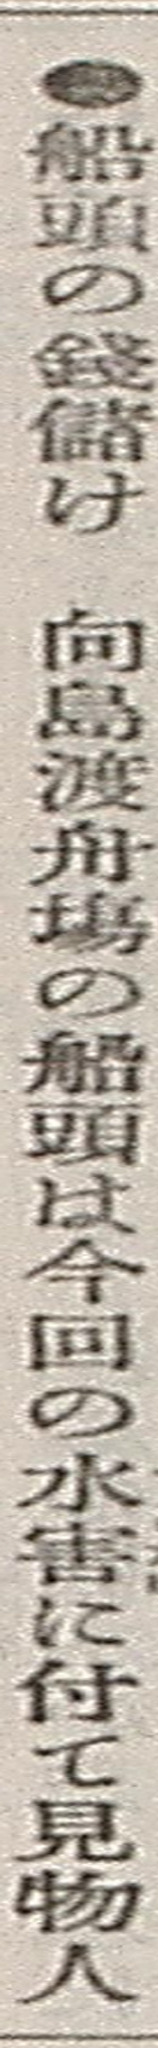●船頭の銭儲け向島渡舟場の船頭は今回の水害に付て見物人
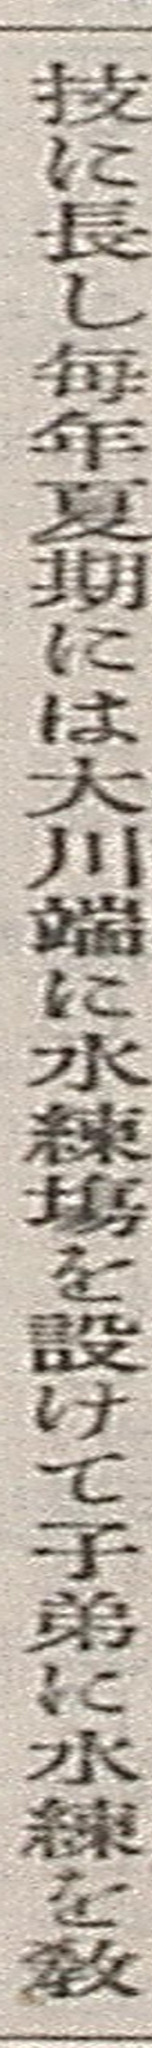技に長し毎年夏期には大川端に水練場を設けて子弟に水練を教
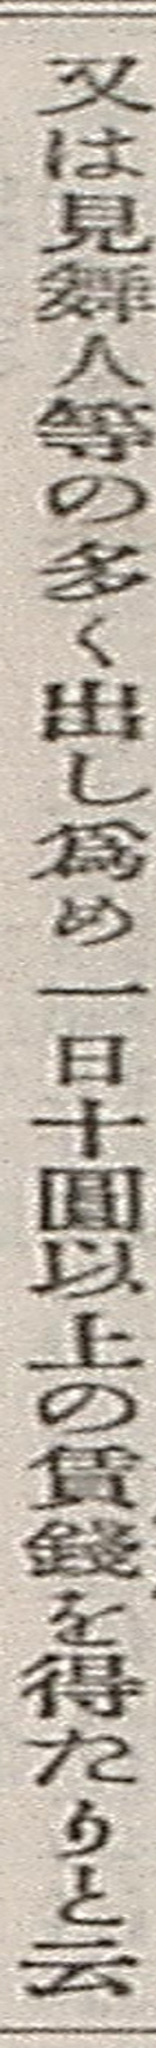又は見舞人等の多く出し為め一日十円以上の賃銭を得たりと云
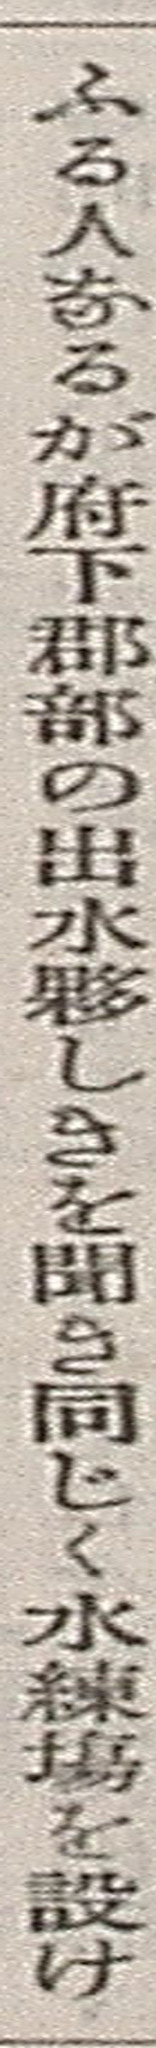ふる人なるが府下郡部の出水夥しきを聞き同じく水練場を設け
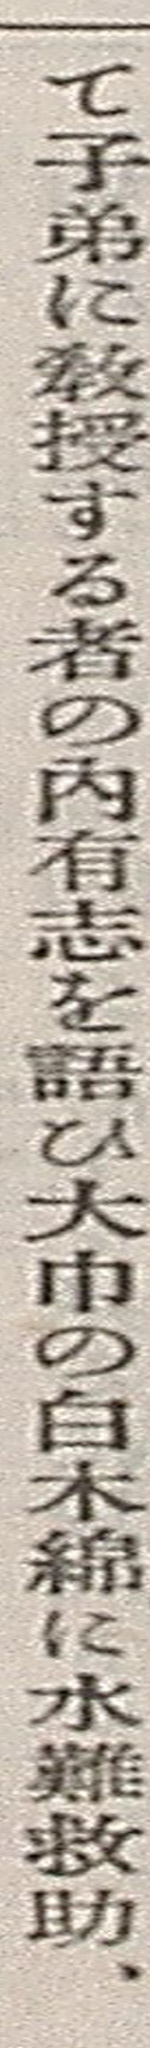て子弟に教授する者の内有志を語ひ大巾の白木綿に水難救助、
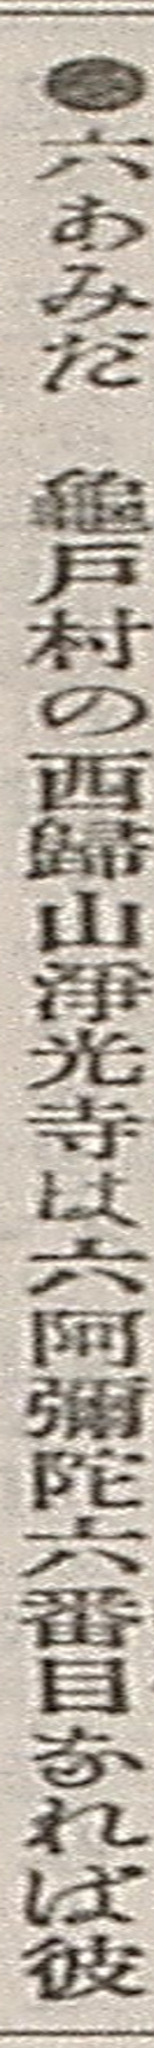●六あみだ亀戸村の西帰山浄光寺は六阿弥陀六番目なれば彼
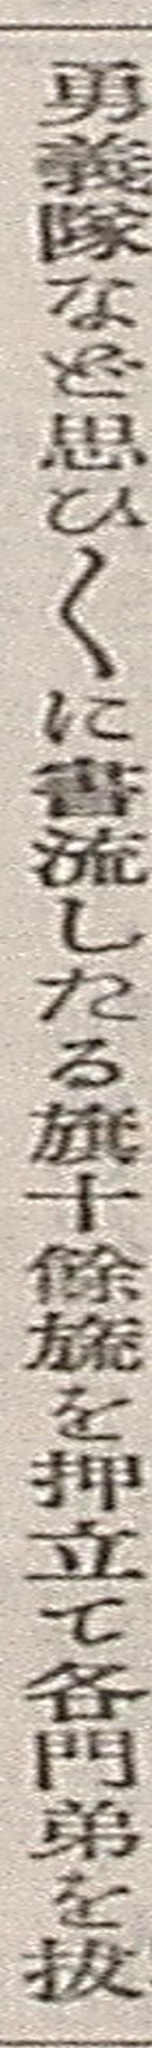勇義隊など思ひ〳〵に書流したる旗十余旒を押立て各門弟を抜
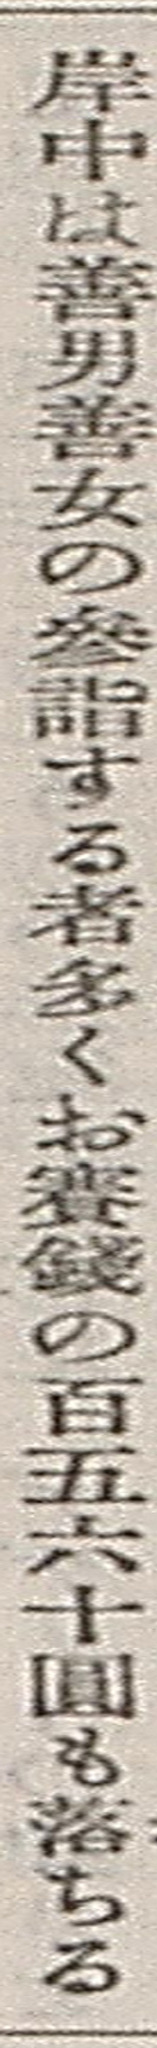岸中は善男善女の参詣する者多くお賽銭の百五十六円も落ちる
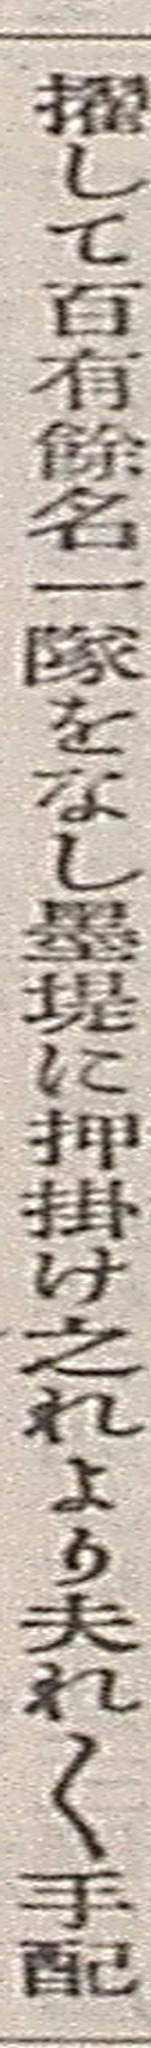擢して百有余名一隊をなし墨堤に押掛け之れより夫れ〳〵手配
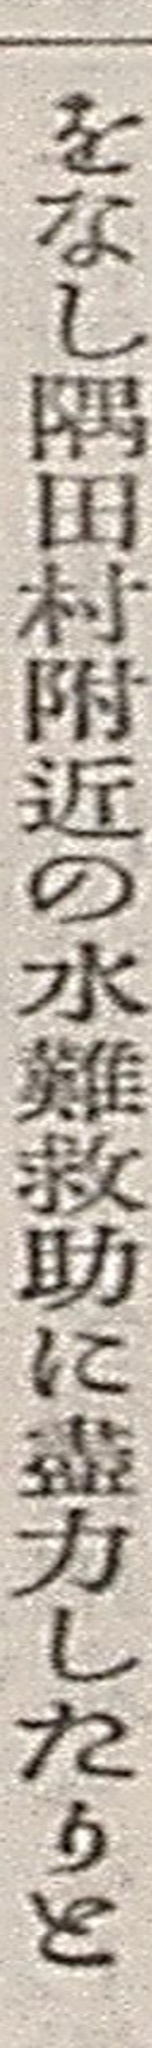をなし隅田村附近の水難救助に尽力したりと
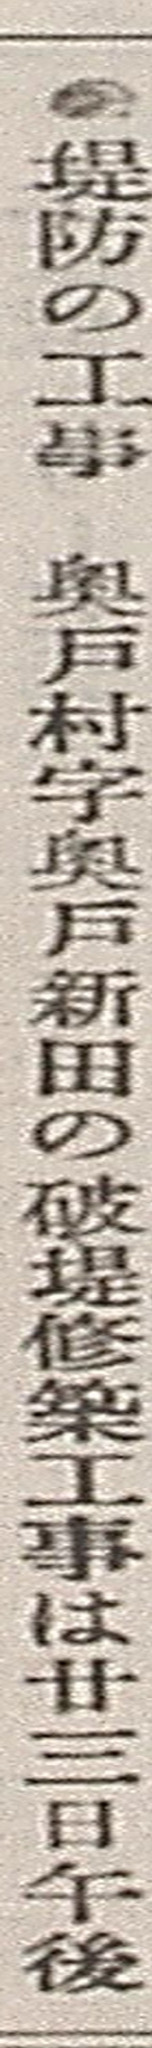●堤防の工事奥戸村字奥戸新田の破堤修築工事は廿三日午後
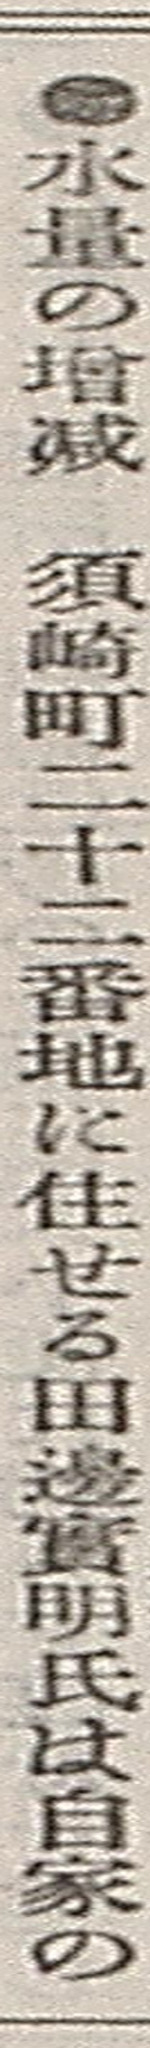●水量の増減須崎町二十二番地に住せる田邊實明氏は自家の
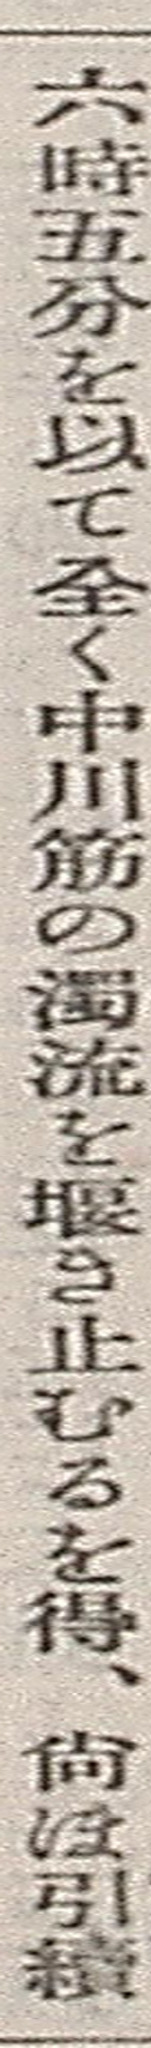六時五分を以て全く中川筋の濁流を堰き止むるを得、尚ほ引続
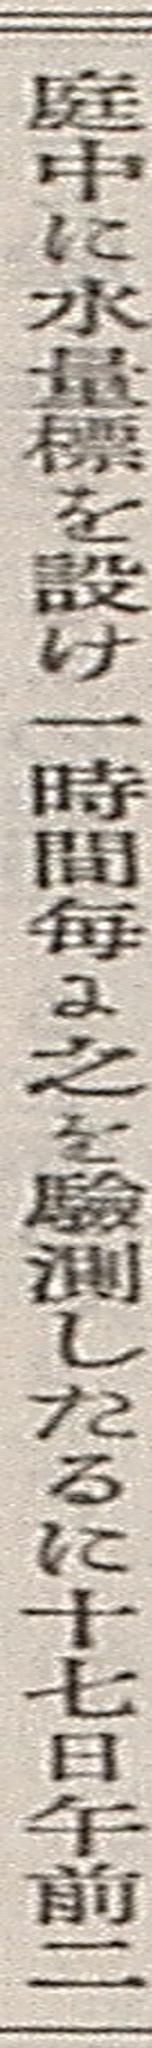庭中に水量標を設け一時間毎に之を験測したるに十七日午前ニ
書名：風俗畫報臨時増刊第百二十四號　洪水地震被害録（上）
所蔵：東京大学地震研究所図書室 Earthquake Research Institute Library, The University of Tokyo, JAPAN
